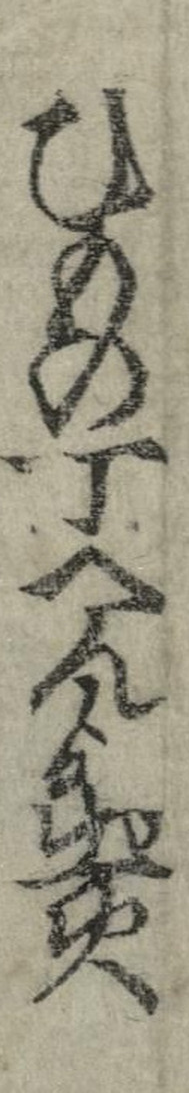ひもの丁へんゟ出火
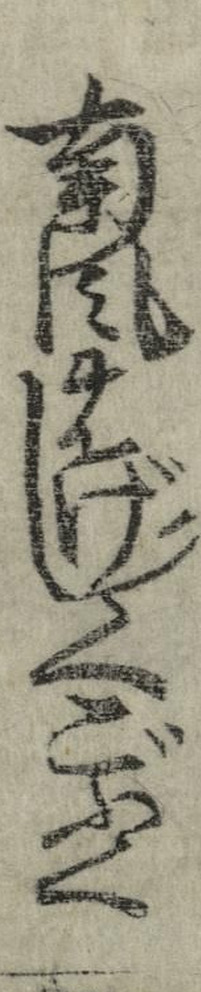南風はげしくごふく
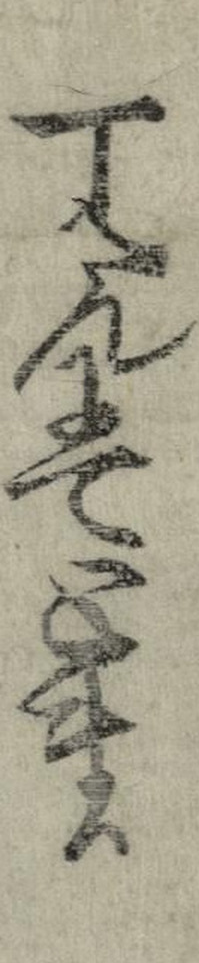丁へんにてとまる
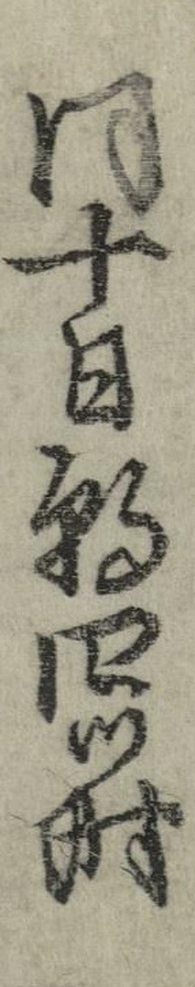同十日朝四ツ時
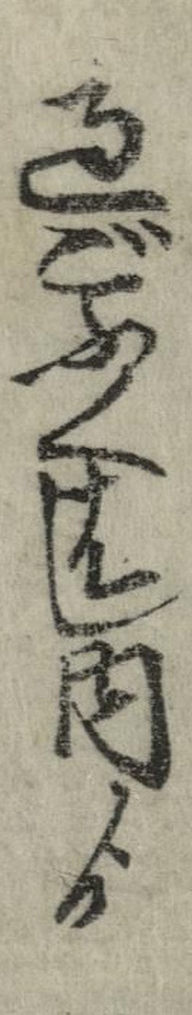過ごふくはし内ゟ
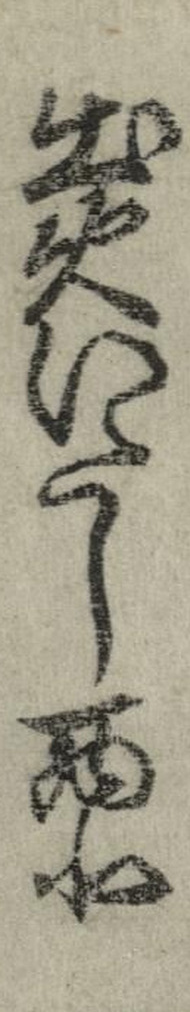出火いたし南北
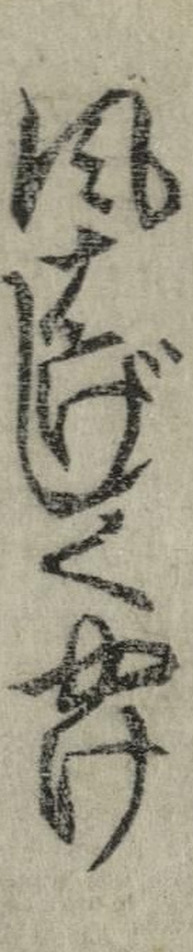風はげしくやけ
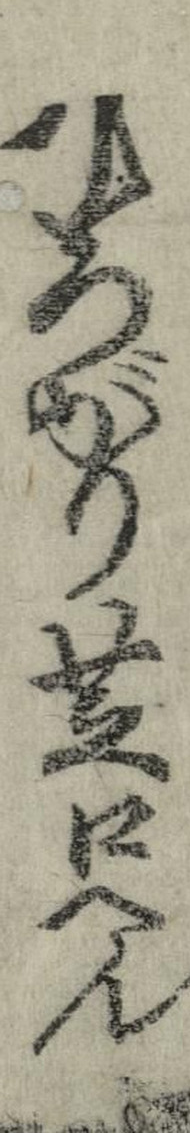ひろがり芝口へん
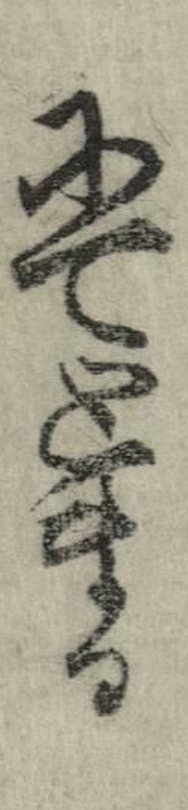にてとまる
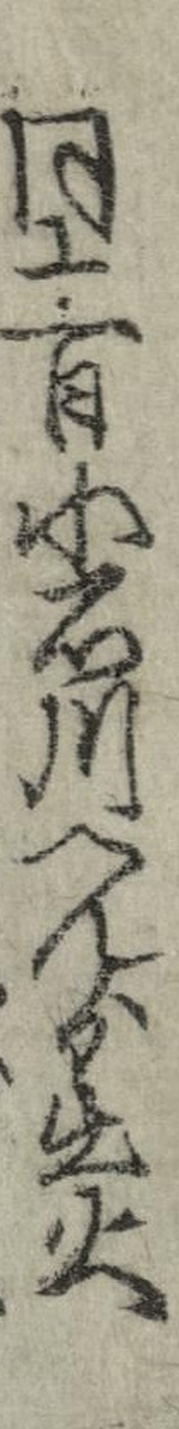同十一日に石川へんゟ出火
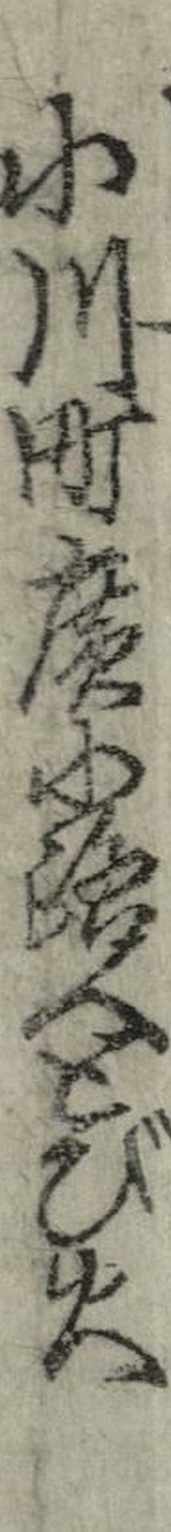小川町広小路へとび火
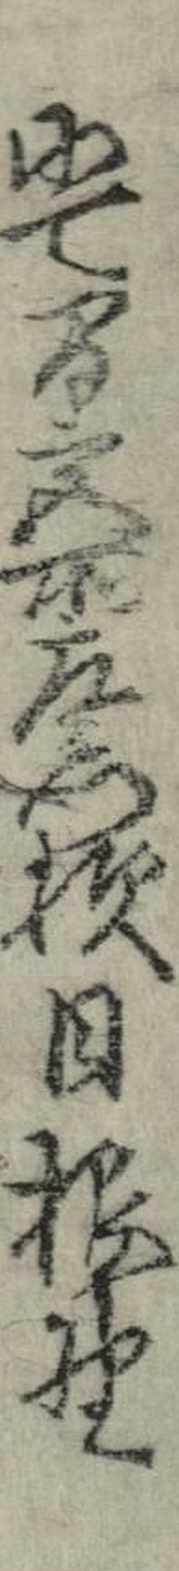にて間宮所左衛門様日根野
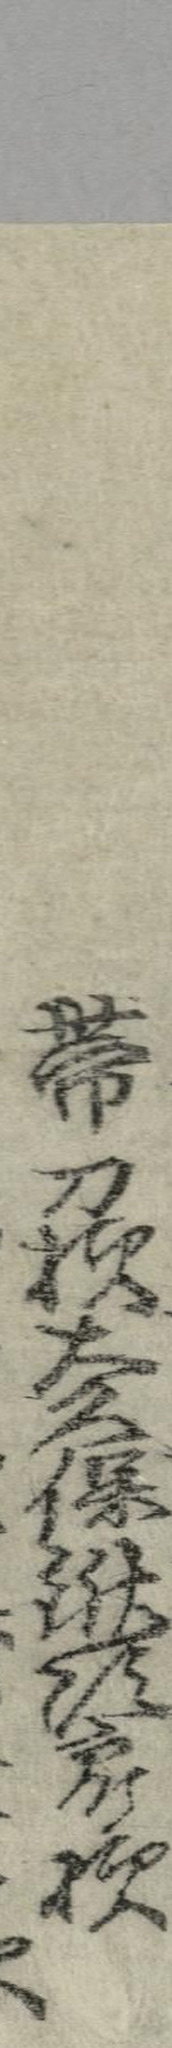帯刀様大久保鍬次郎様
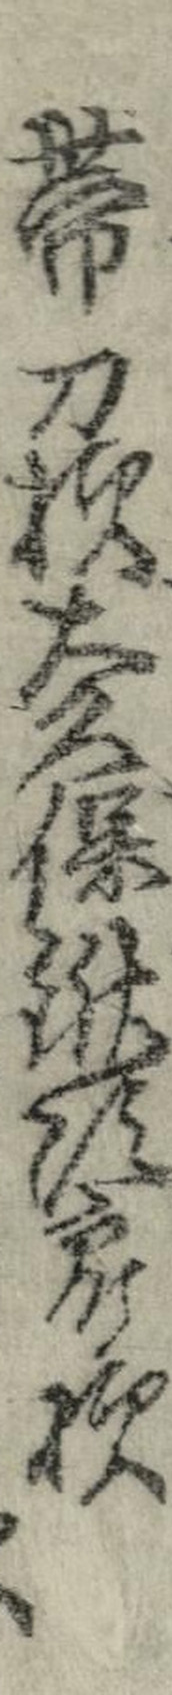帯刀様大久保鍬次郎様
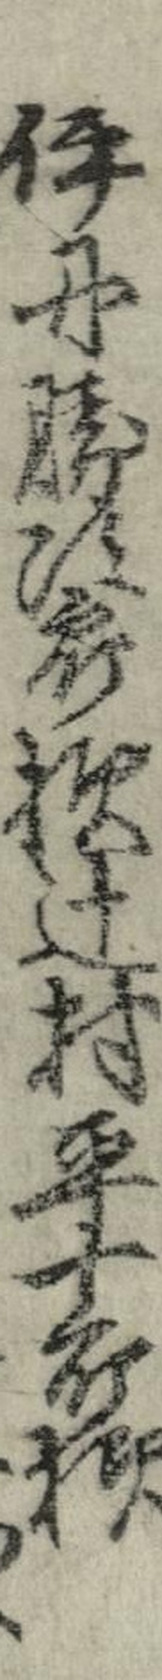伊丹勝次郎様辻村平十郎様
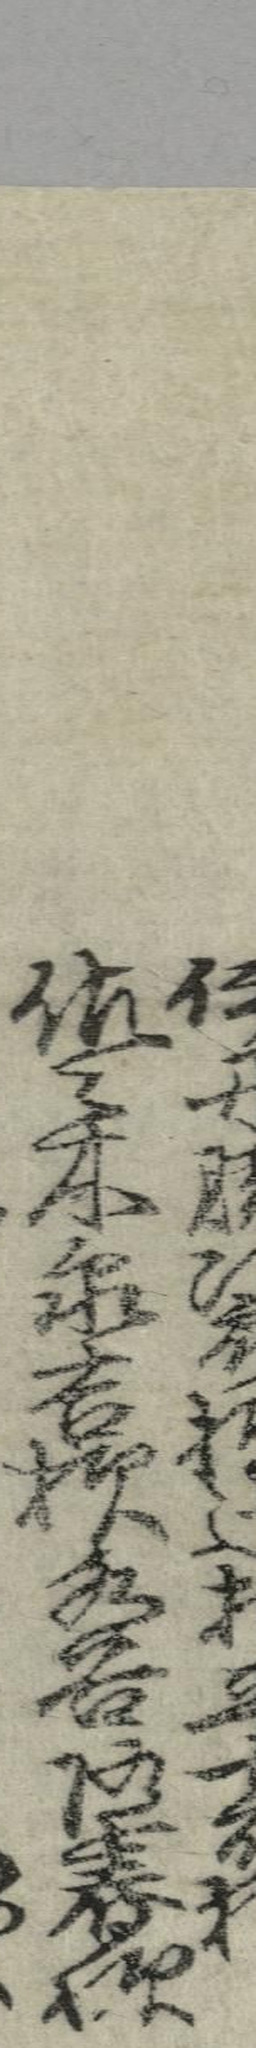佐ゝ木亀吉様水谷随春様
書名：方角繪圖面
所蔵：東京大学地震研究所図書室 Earthquake Research Institute Library, The University of Tokyo, JAPAN
